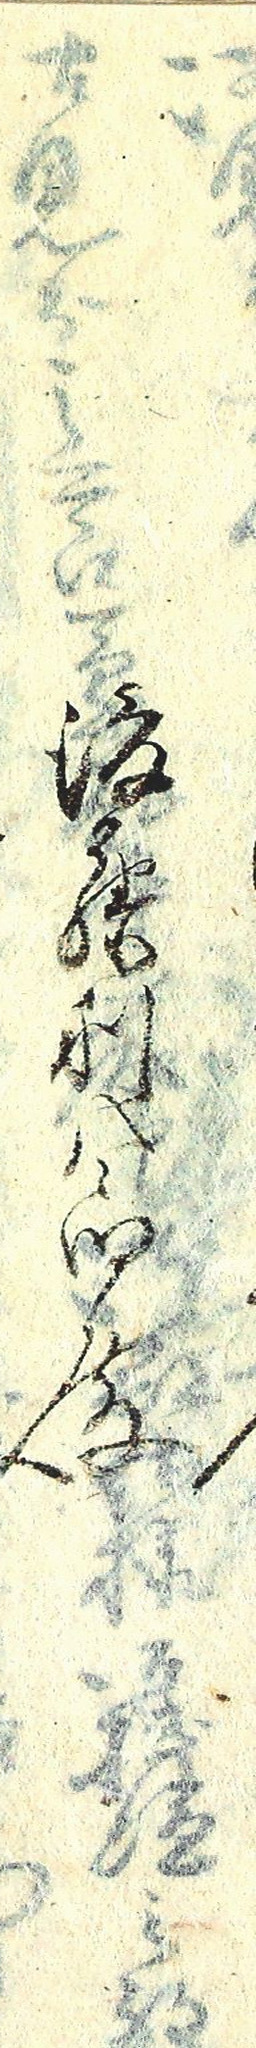後藤利八郎殿
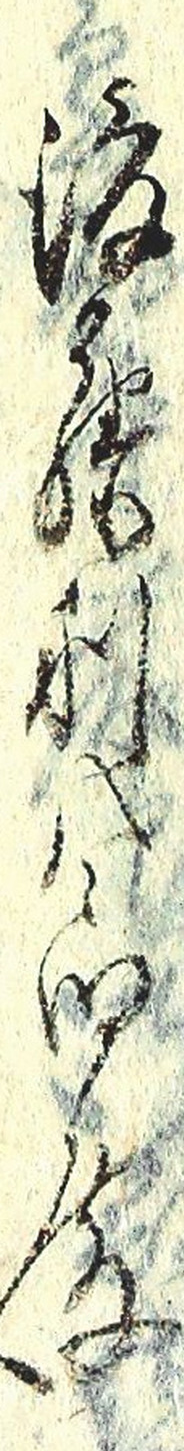後藤利八郎殿
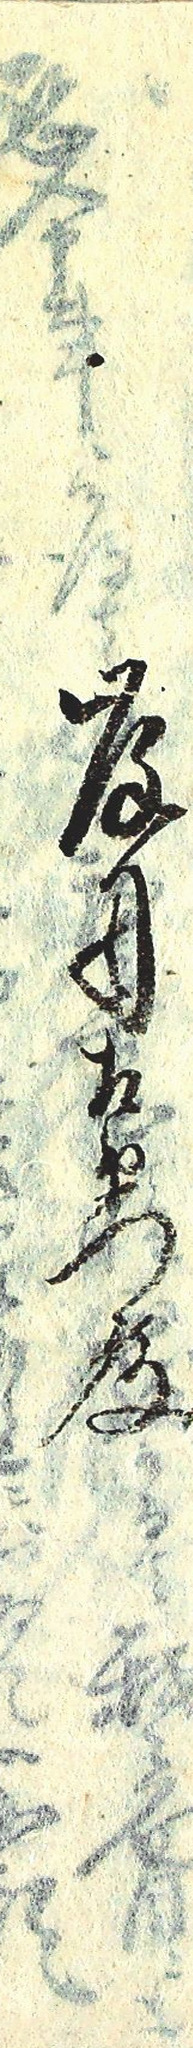岸周左衛門殿
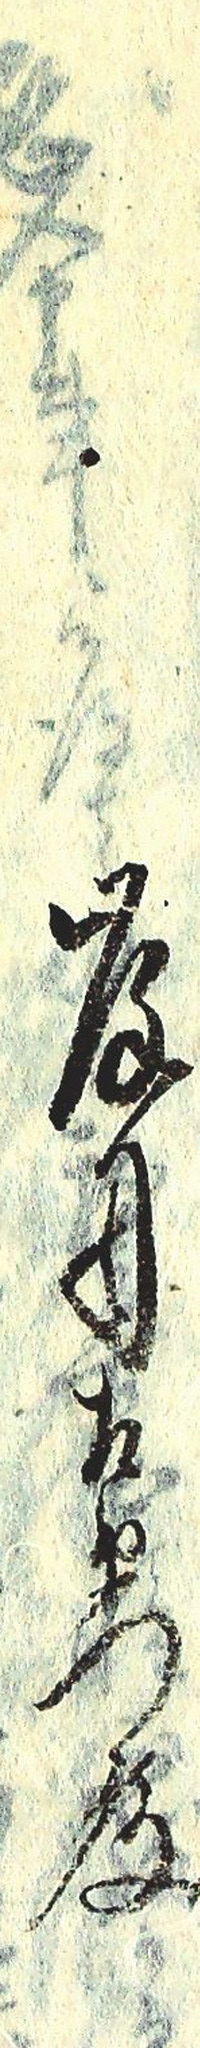岸周左衛門殿
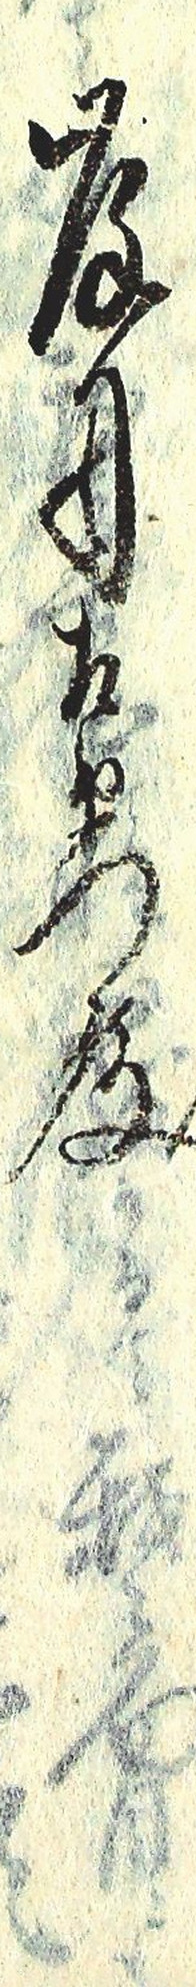岸周左衛門殿
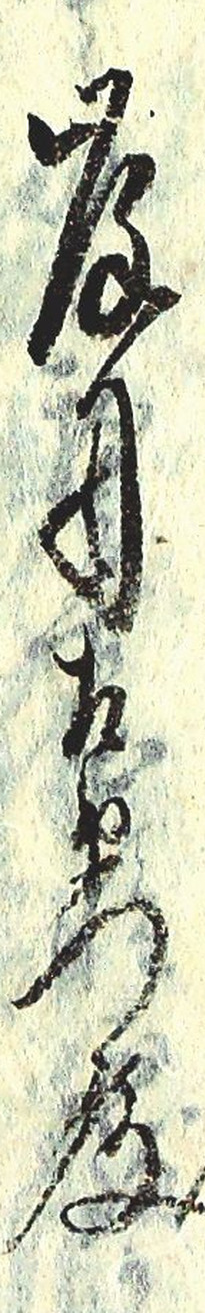岸周左衛門殿
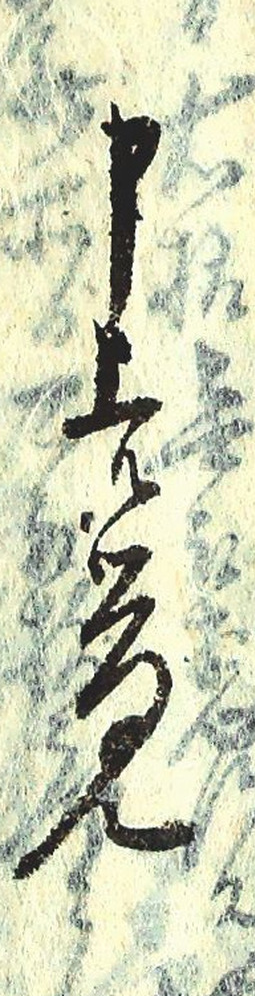申上る覚
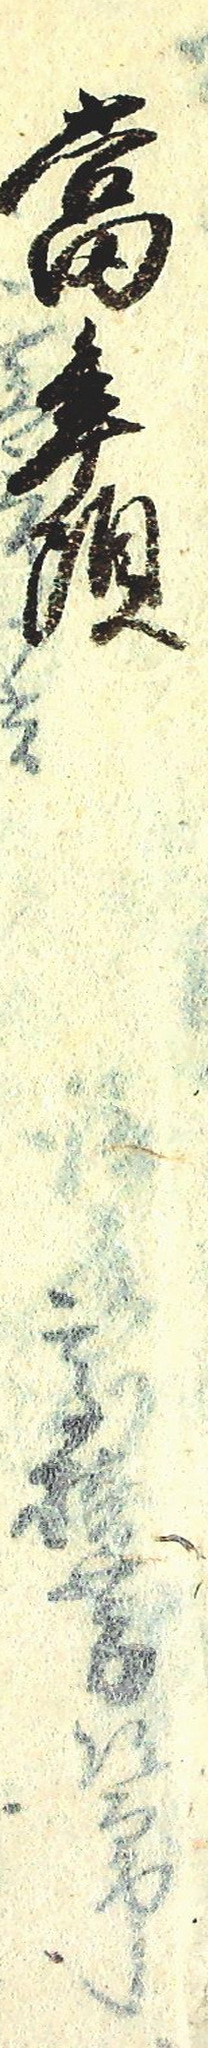当年頭
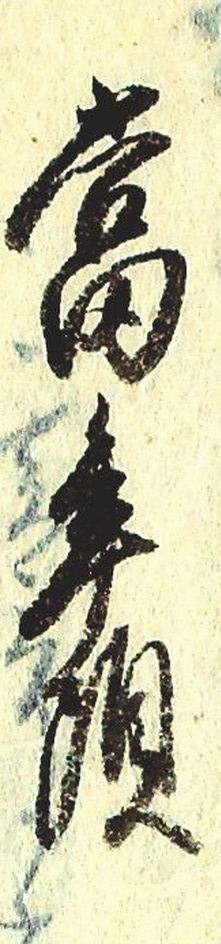当年頭
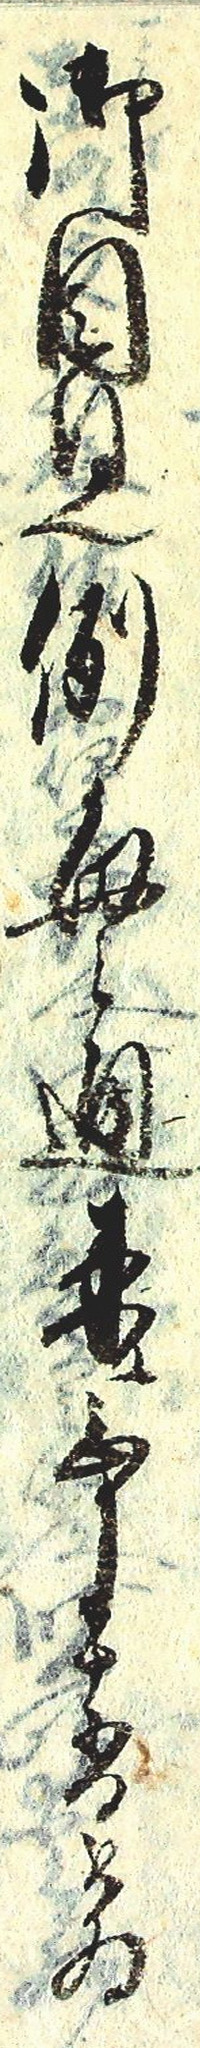御目見例毎之通来る正月十五日被為
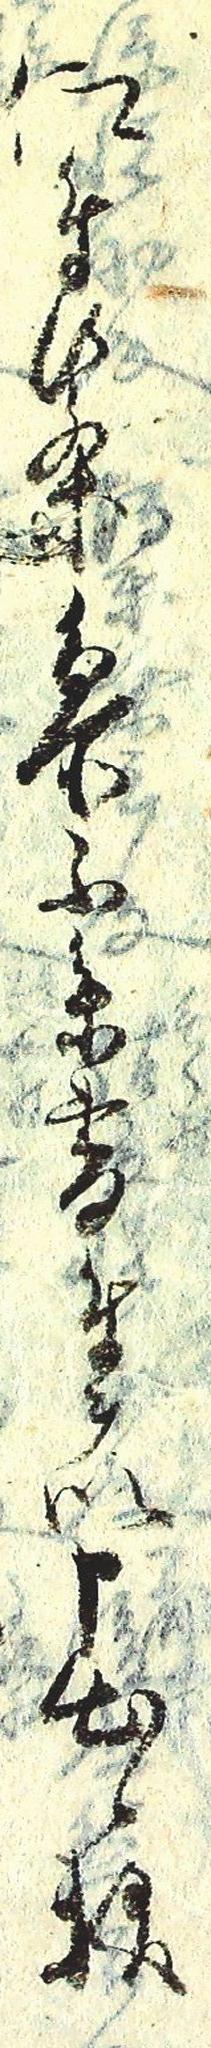仰付候条参不参書付を以申出候様
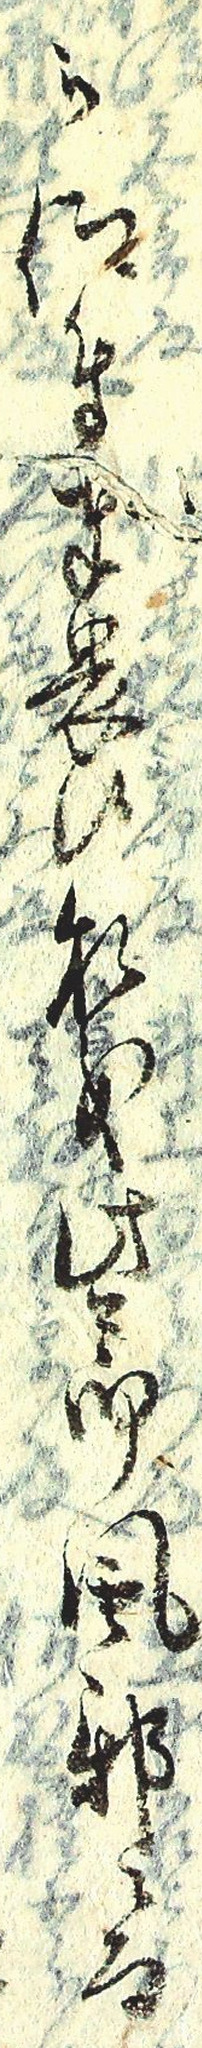被仰付奉畏候私義此節風邪にて
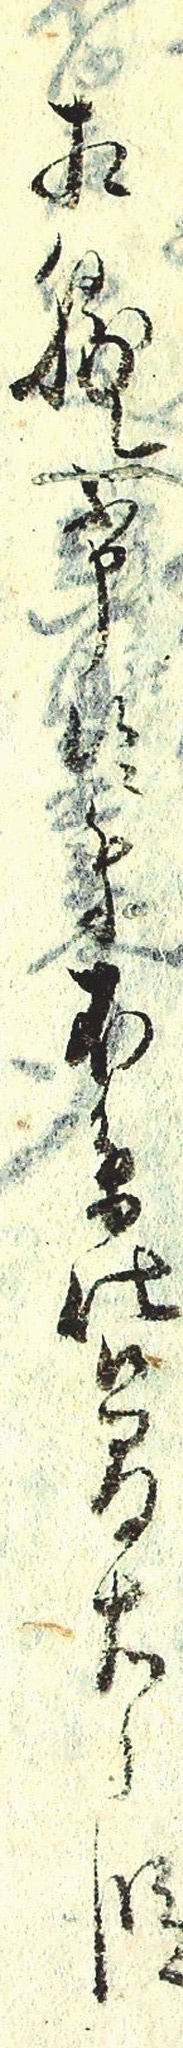相勝れ不申候に付不参仕候間右之段
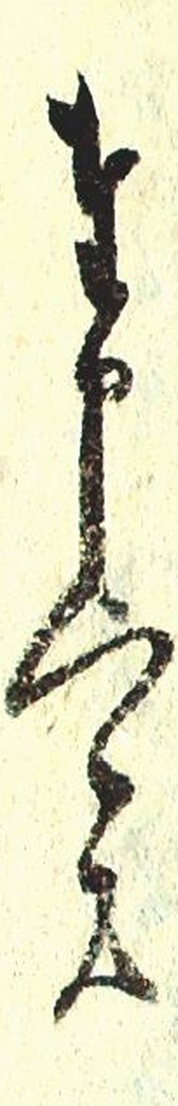奉申上候以上
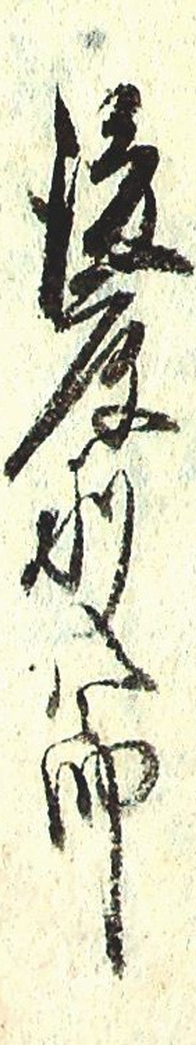後藤利八郎
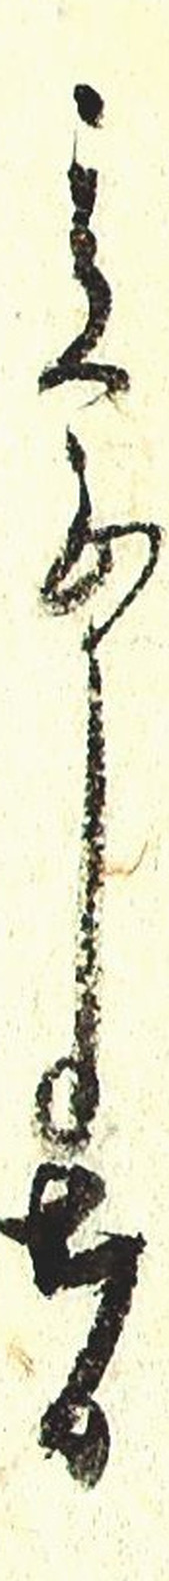亥正月七日
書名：諸御願書控(弐番）
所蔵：鳴門教育大学 Naruto University of Education
